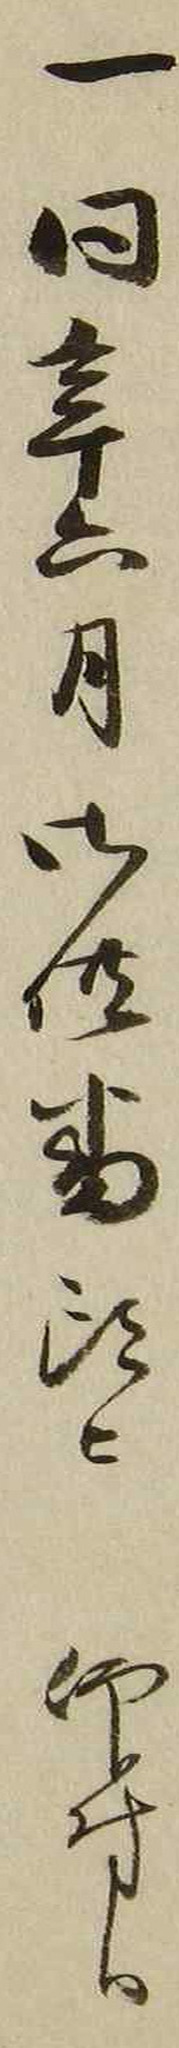一同年六月御供番頭被仰付候
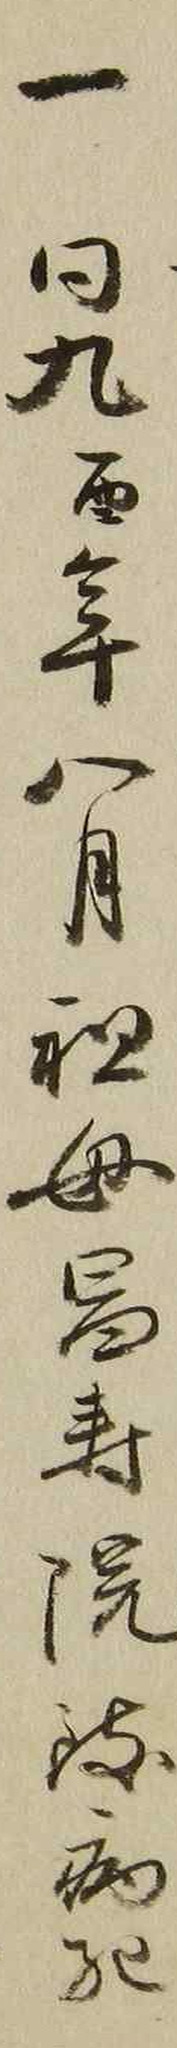一同九酉年八月祖母昌寿院致病死
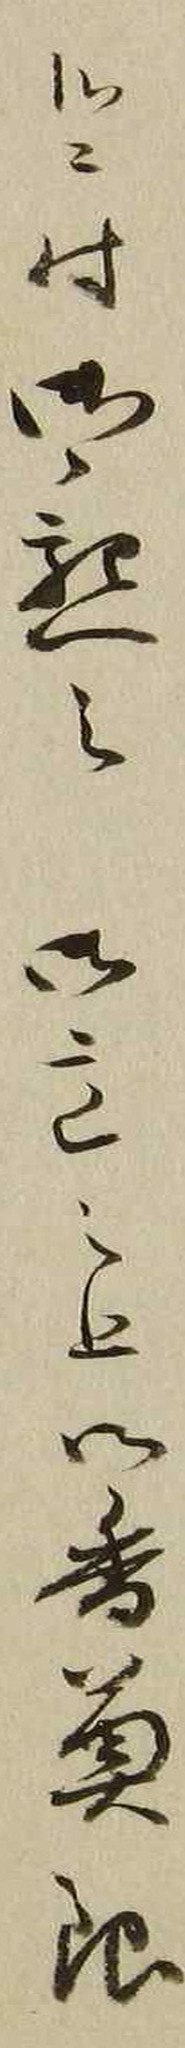候に付御懇之御意之上御香典銀
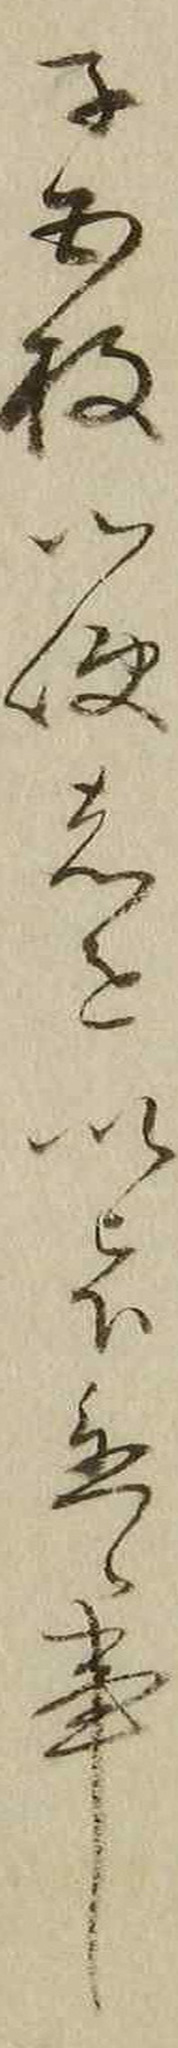子五枚御使者を以被下置候事
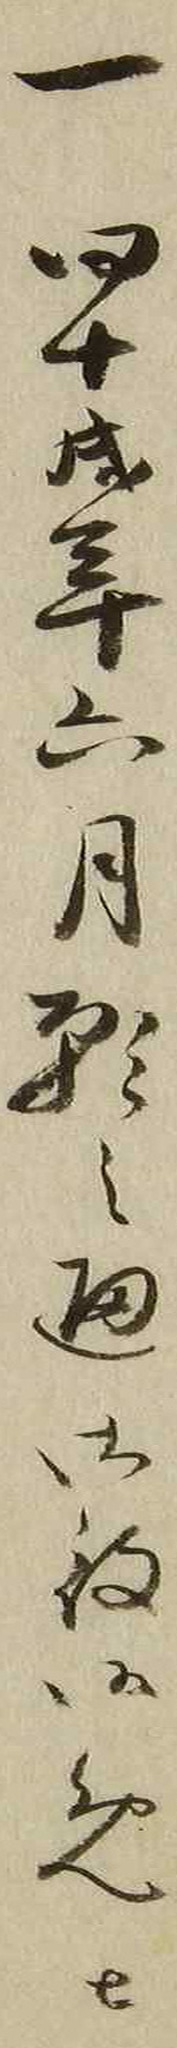一同十戌年六月願之通御役御免被
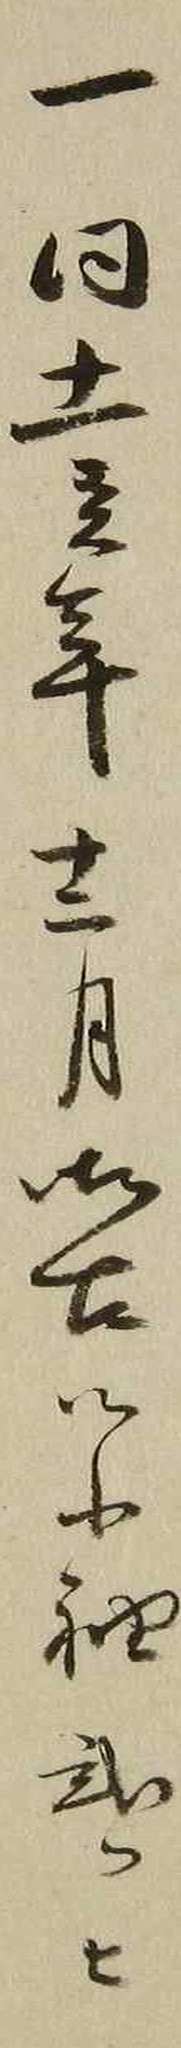一同十一亥年十二月御召御小袖弐つ被
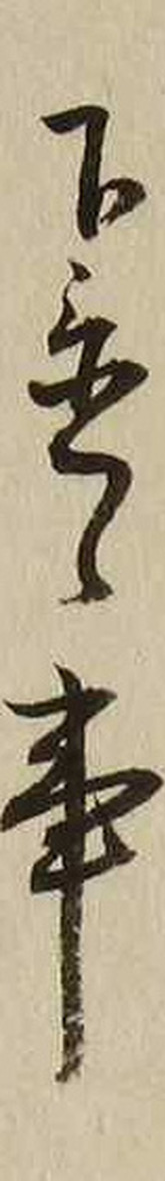下置候事
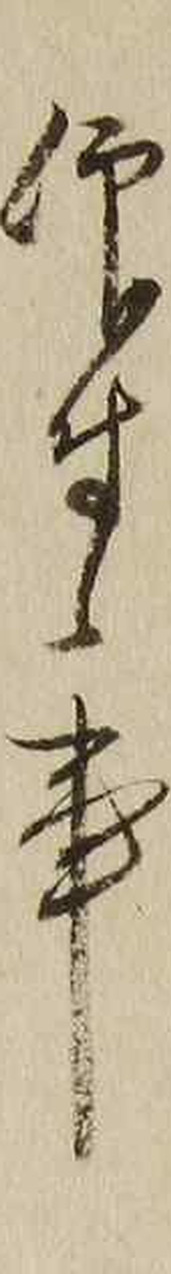仰成候事
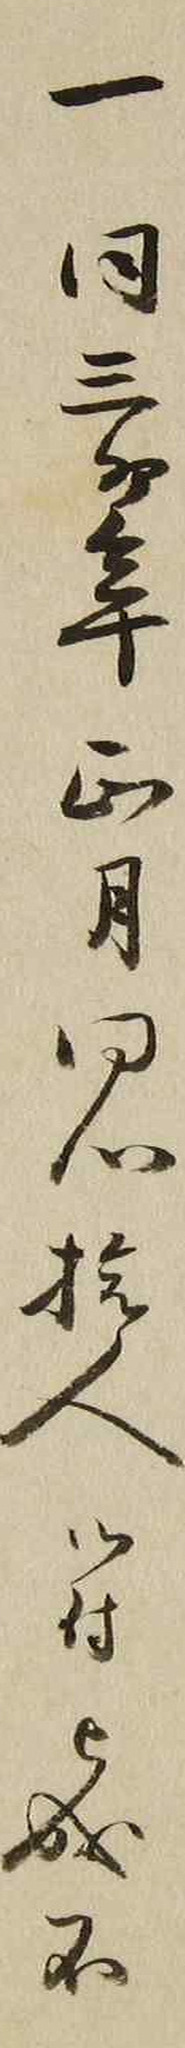一延宝二寅年正月同心拾人御付被成不
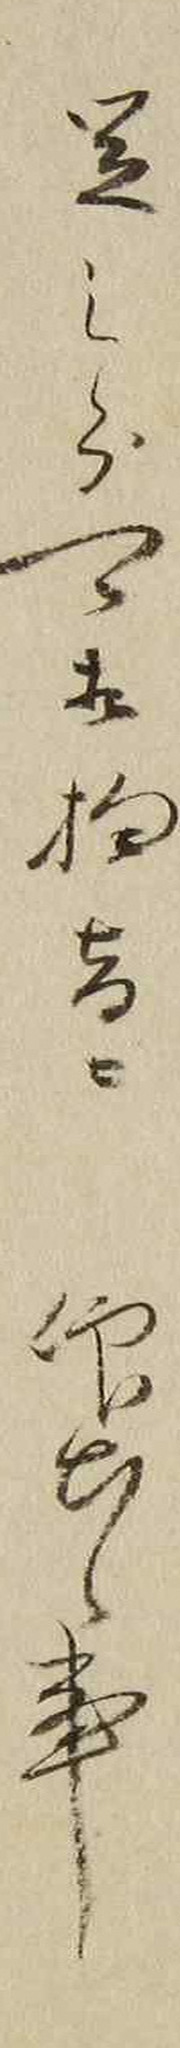足之分可相抱旨被仰出候事
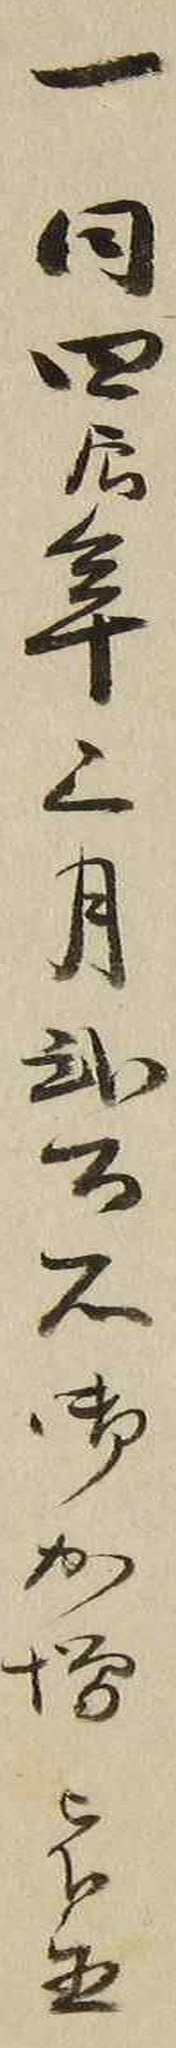一同四辰年三月弐百石御加増被下置
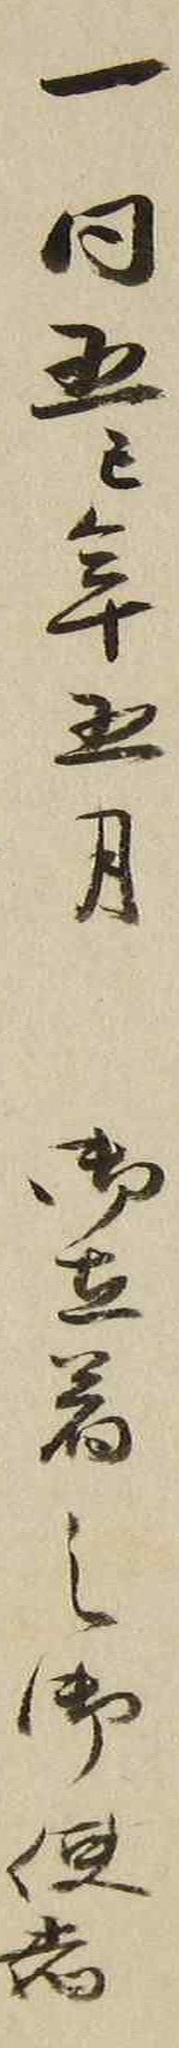一同五巳年五月御在着之御使者
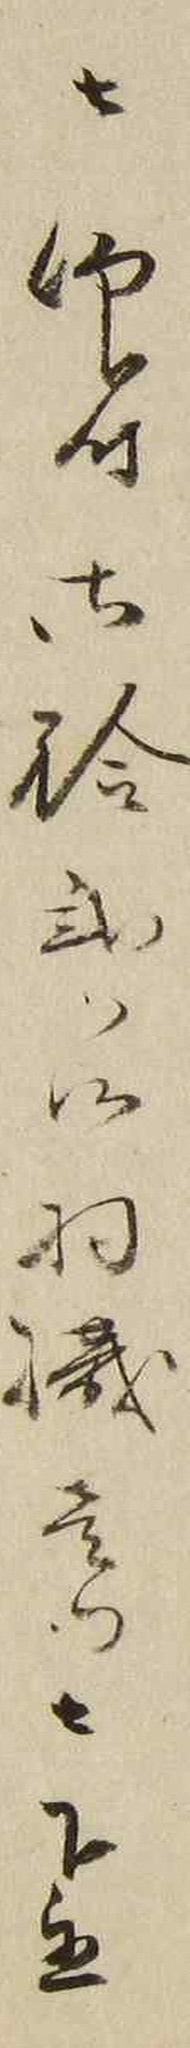被仰付御袷弐つ御羽織一つ被下置
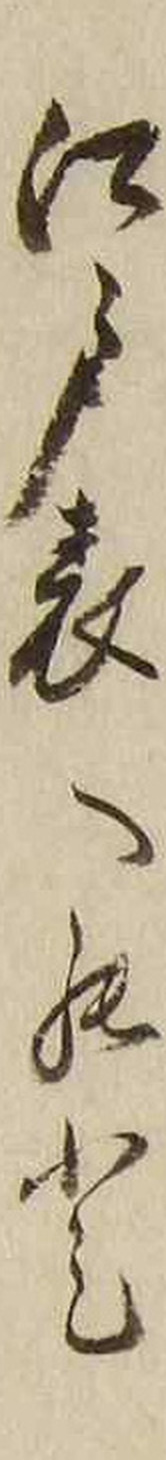江戸表へ罷登

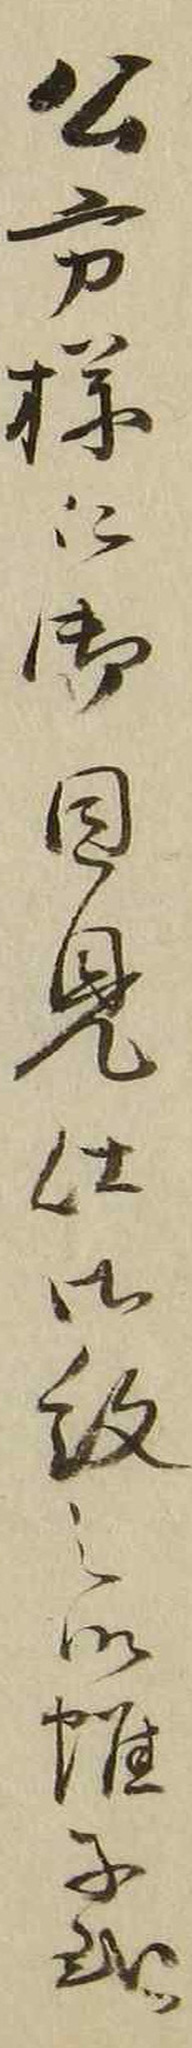公方様江御目見仕御紋之御帷子弐つ
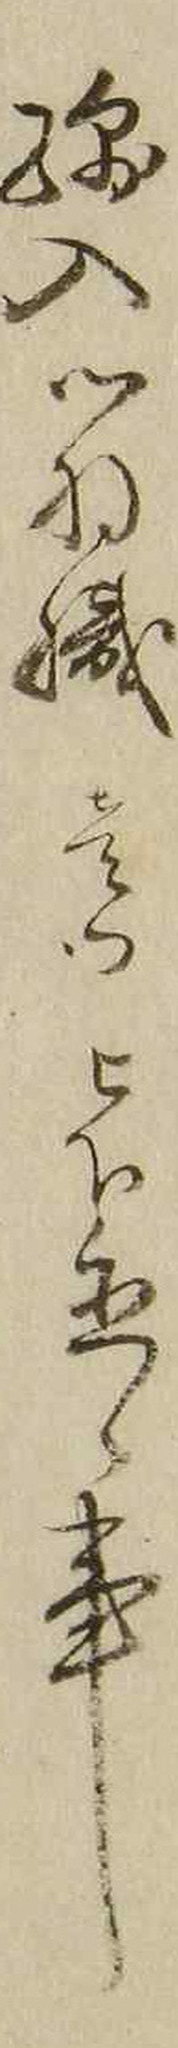綿入御羽織壱つ被下置候事
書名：諸士系譜　巻之269　さ之部1
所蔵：会津若松市立会津図書館
